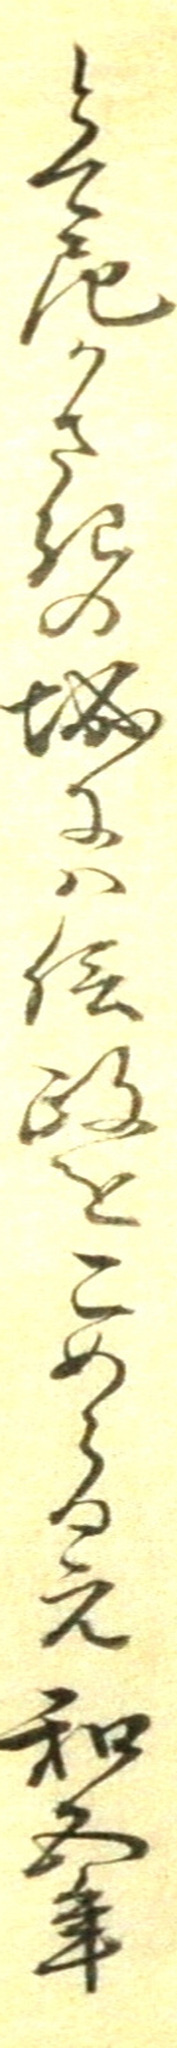とて尼かさきの城には信政をこめらる元和五年
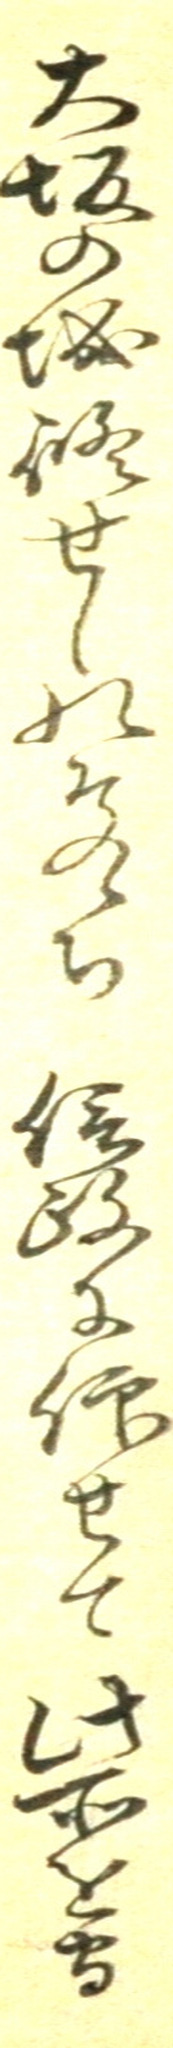大坂の城修せられそのゝち信政に仰せて此所を守
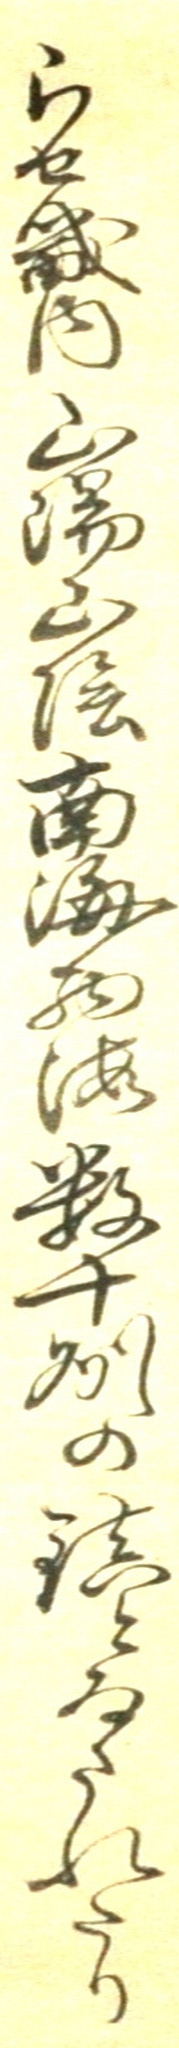らせ畿内山陽山陰南海西海数十州の鎮となされたり
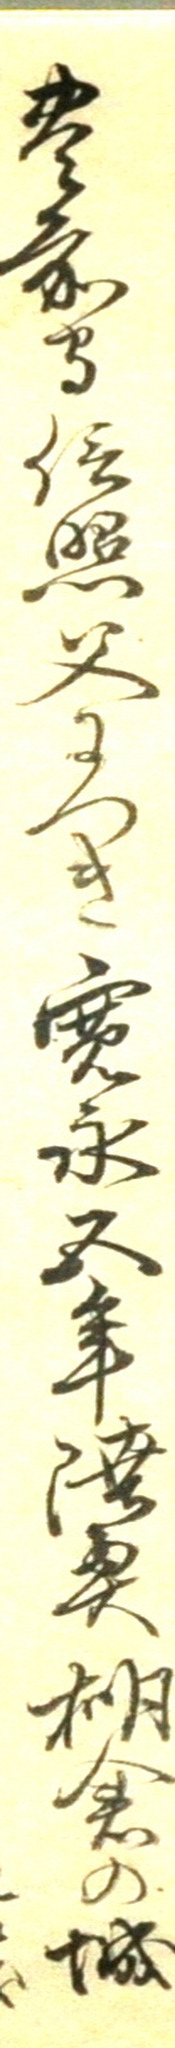豊前守信照父につき寛永五年陸奥棚倉の城
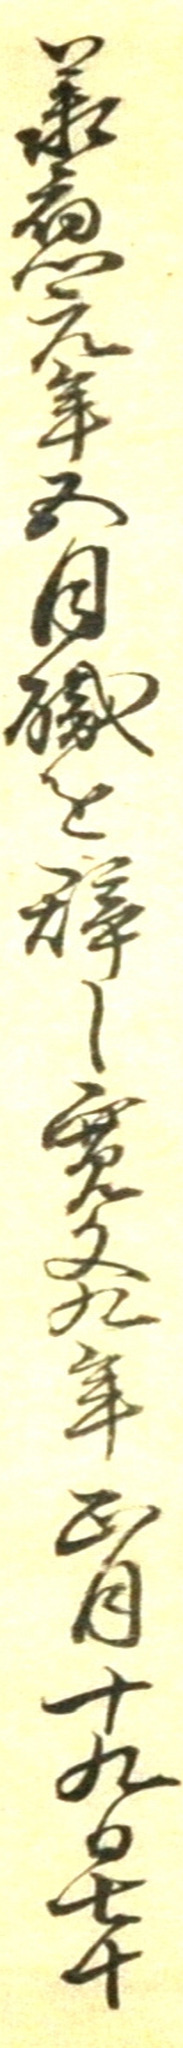承応元年五月職を辞し寛文九年正月十九日七十
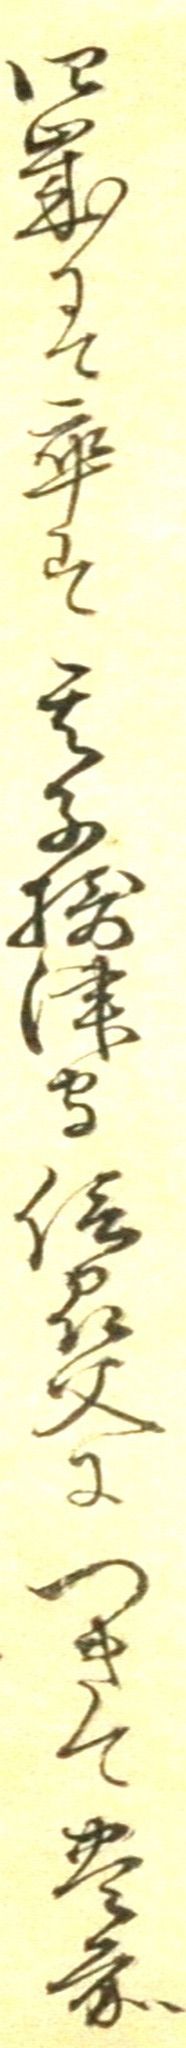四歳にて卒す其子摂津守信良父につきて豊前
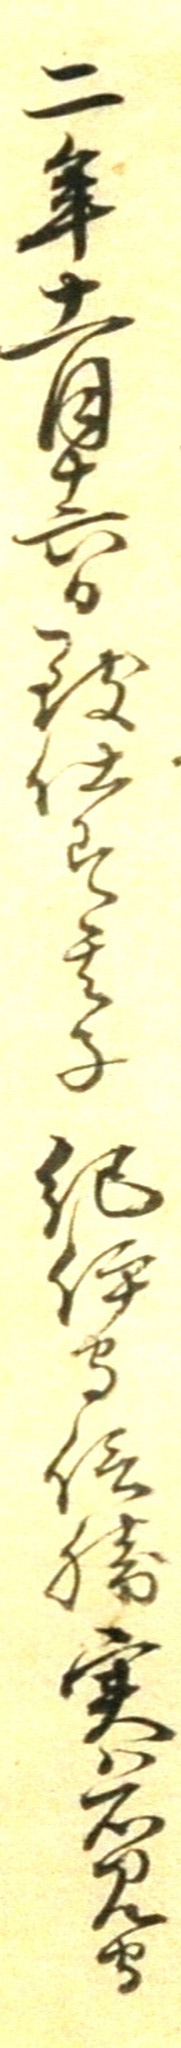二年十一月十六日致仕す其子紀伊守信勝実は石見守
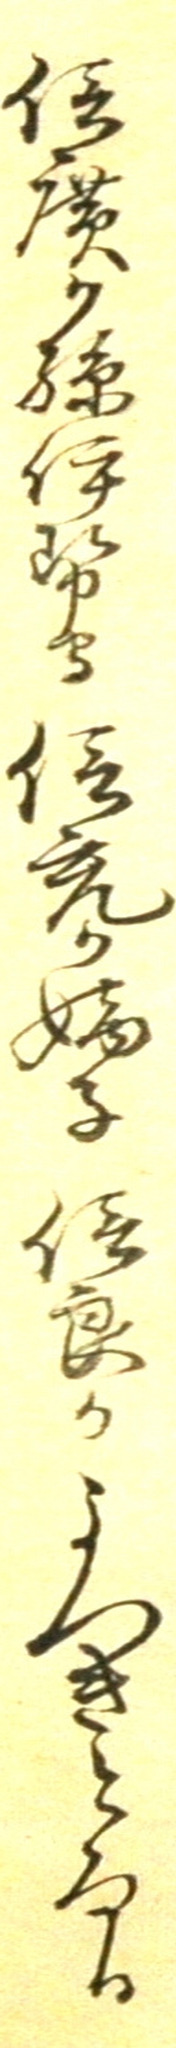信廣か孫伊勢守信充か嫡子信良かよつきとなる

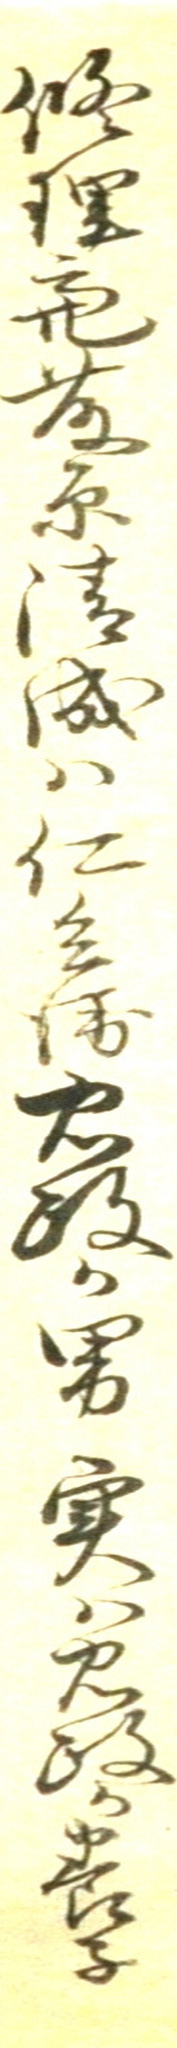修理亮藤原清成は仁兵衛忠政か男実は忠政か養子
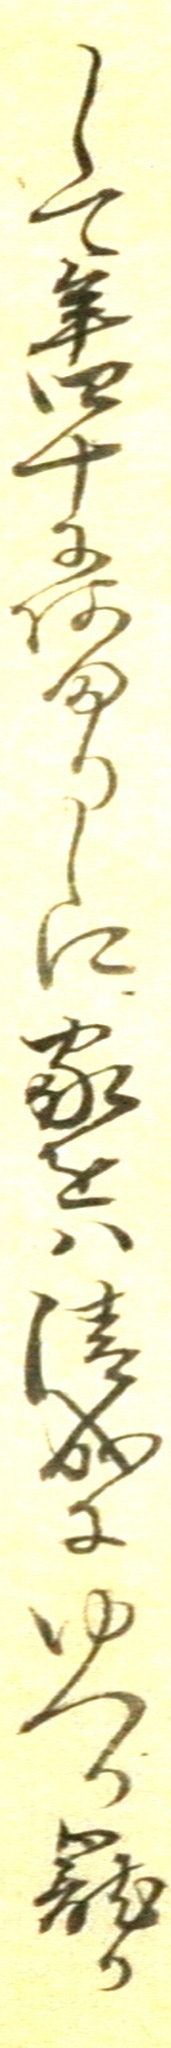して年四十にあまりしに家をは清成にゆつり籠り
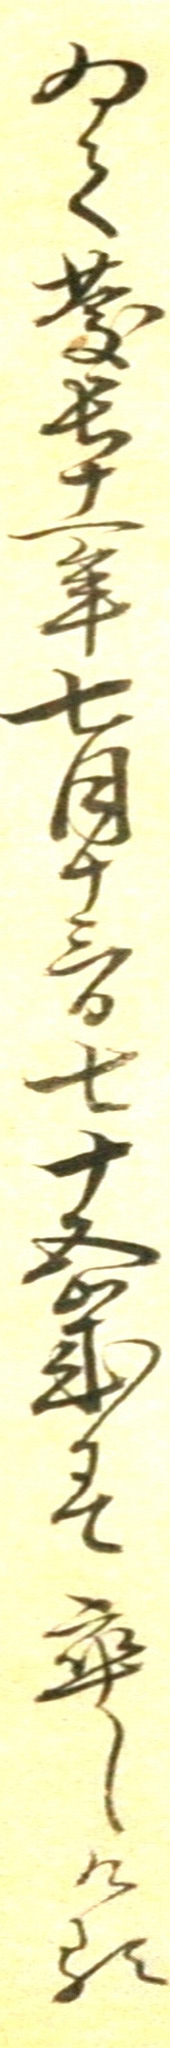ゐて慶長十一年七月十三日七十五歳にて卒しける
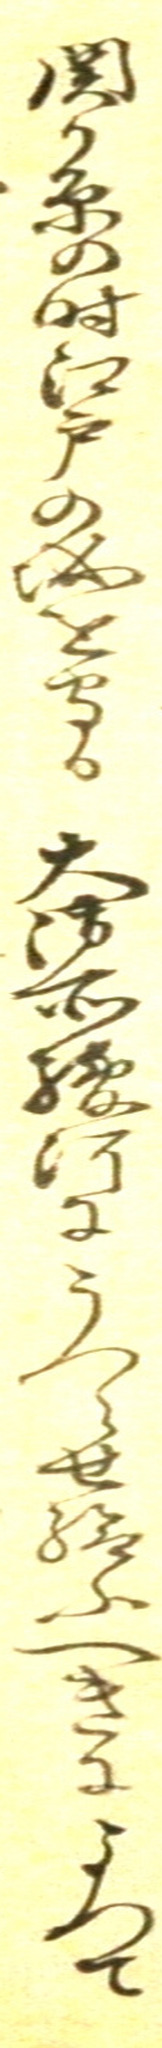関か原の時江戸の城を守る大御所駿河にうつらせ給ふへきによつて
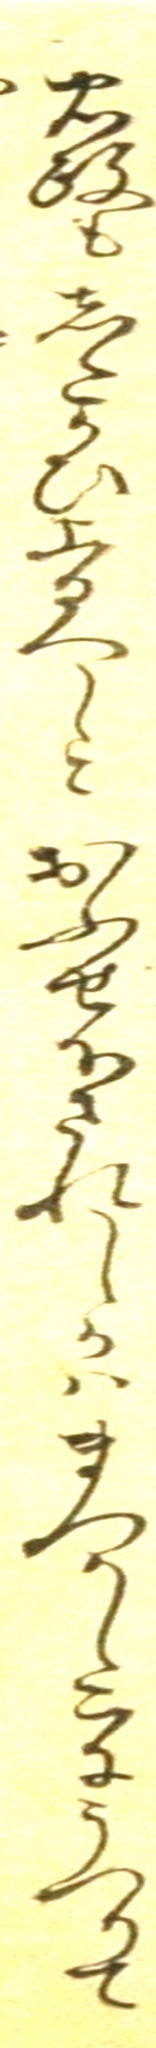忠政もしたかひ上るへしとおふせ下されしかはまつかしこにうつりて

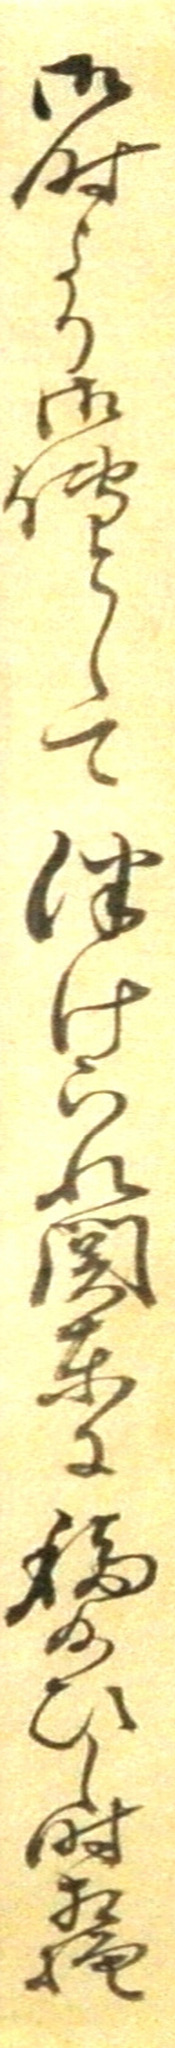御時より御傅としてつけられ関東に移給ひし時相模
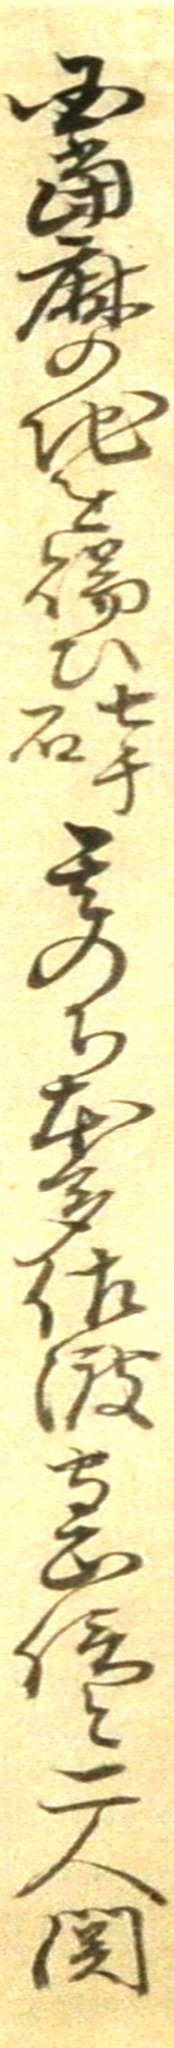国当麻の地を賜ひ七千石其のち本多佐渡守正信と二人関
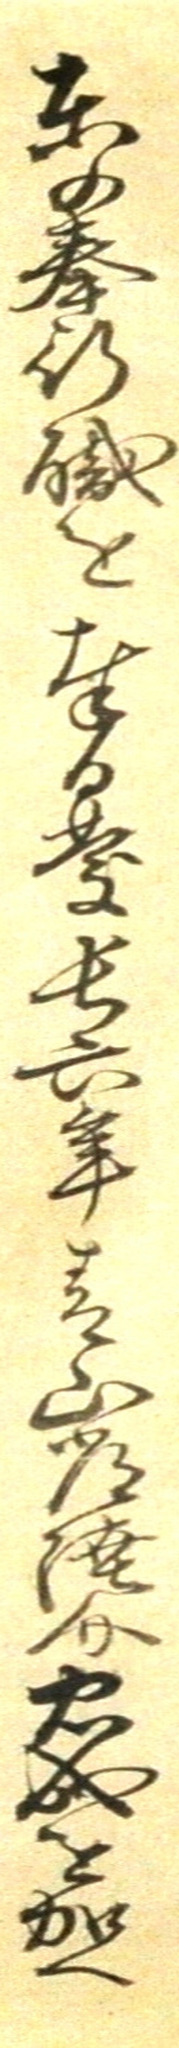東の奉行職を奉る慶長六年青山常陸介忠成を加へ
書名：藩翰譜（四・中）
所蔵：伊那市立高遠町図書館・合同会社AMANE
